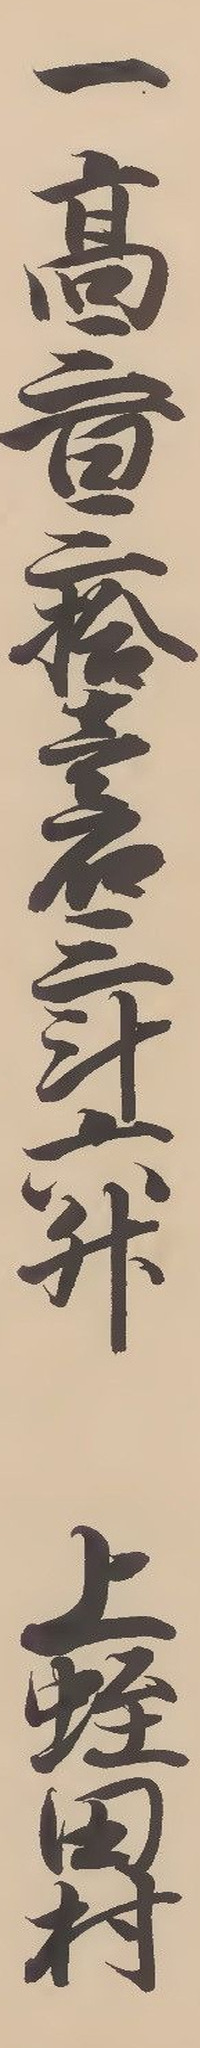一高三百三拾壱石三斗六升上蛭田村
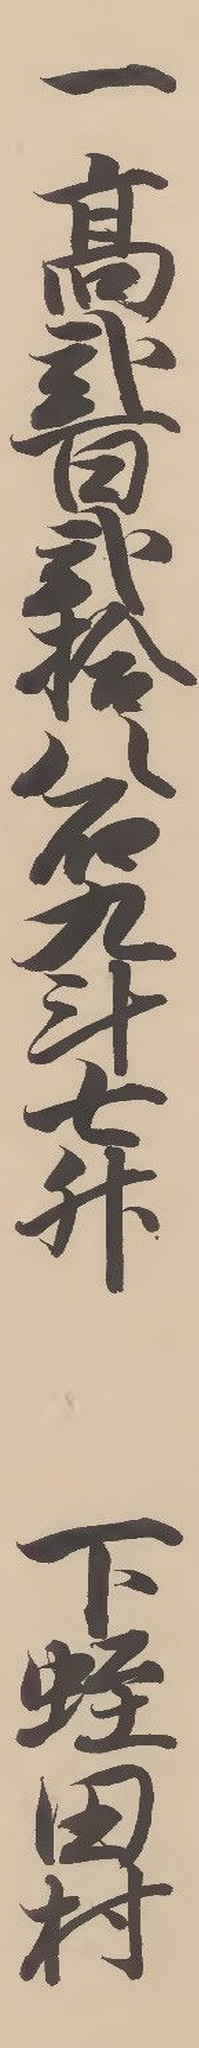一高弐百弐拾八石九斗七升下蛭田村
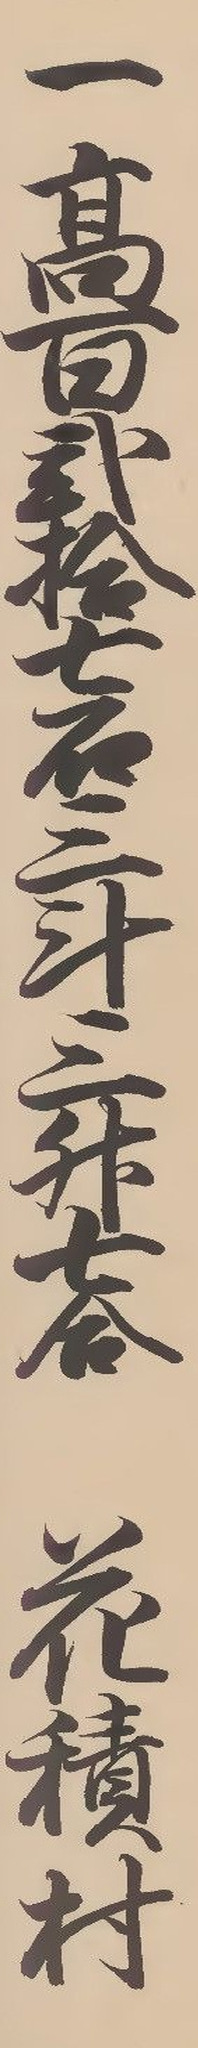一高百弐拾七石三斗三升七合花積村
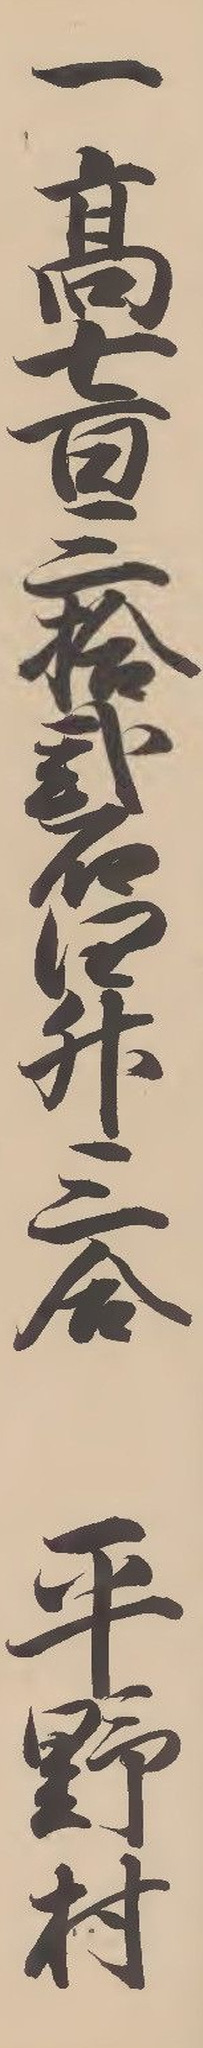一高七百三拾弐石四升三合平野村
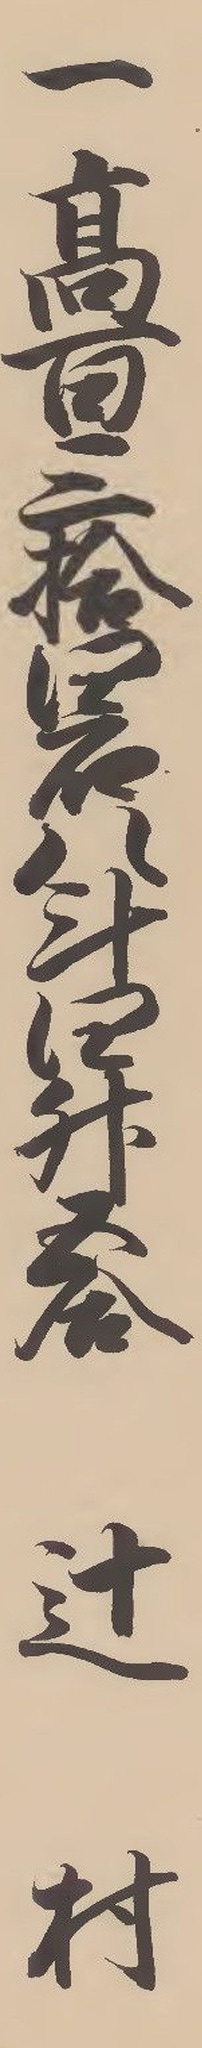一高百三拾四石八斗四升五合辻村
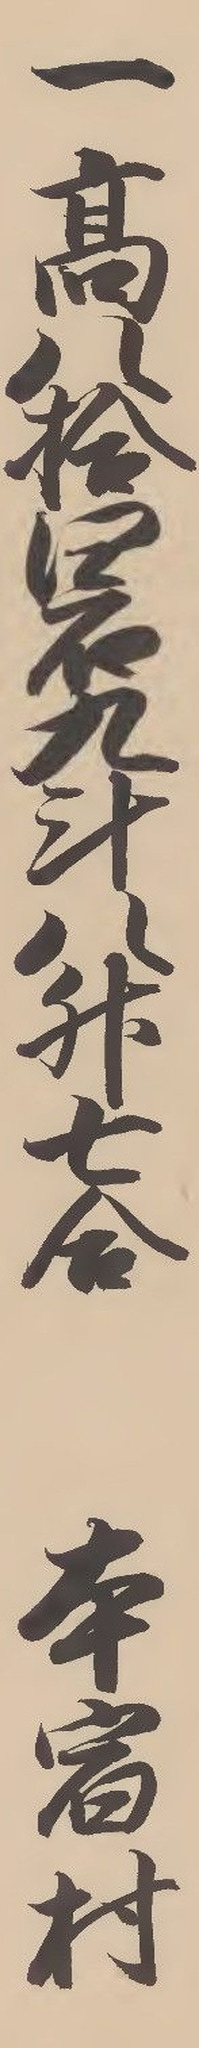一高八拾四石九斗八升七合本宿村
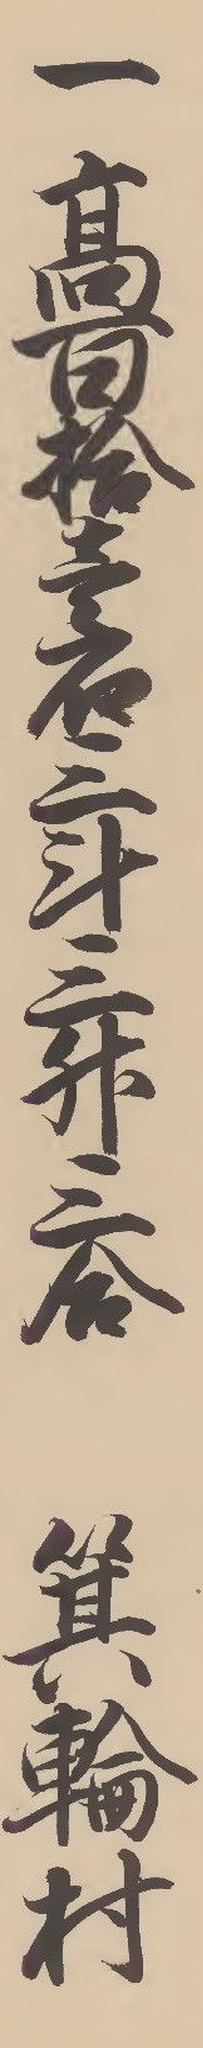一高百拾壱石三斗三升三合箕輪村

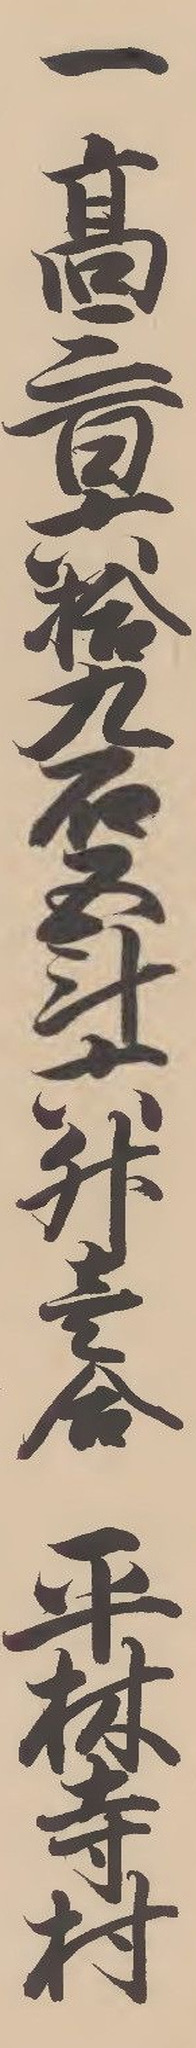一高三百六拾九石五斗六升壱合平林寺村
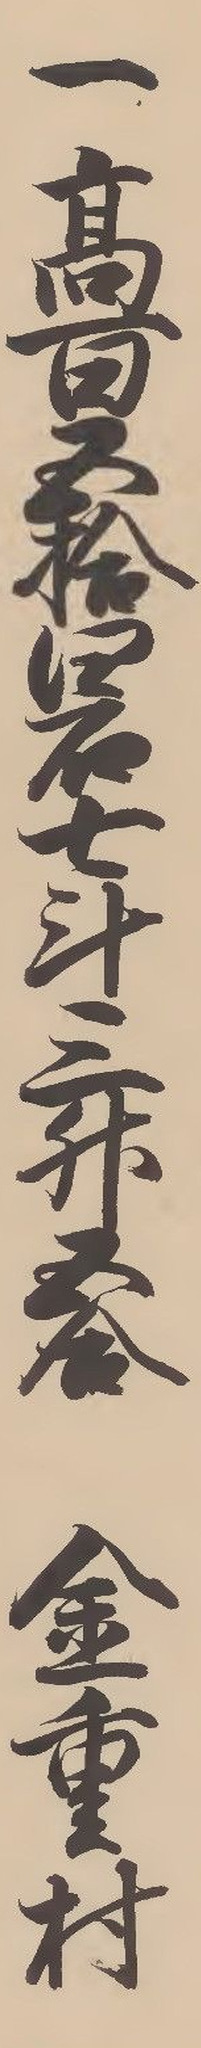一高百五拾四石七斗三升五合金重村
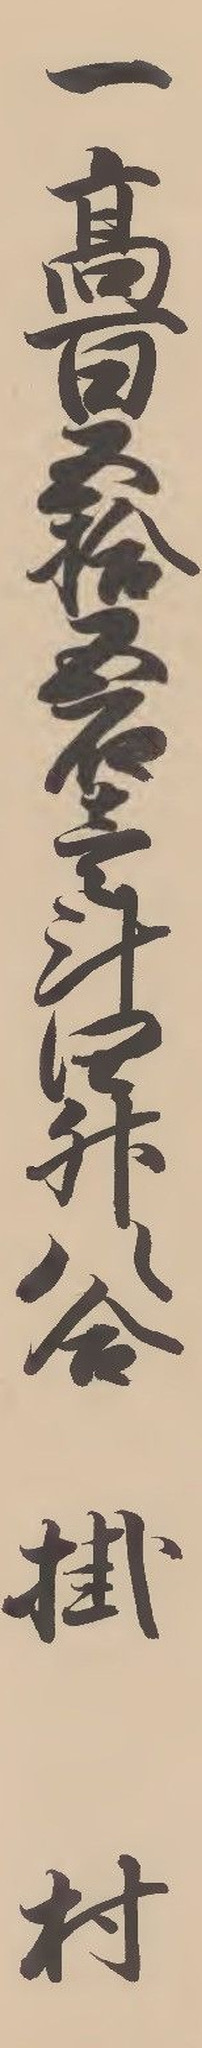一高百五拾五石壱斗四升八合掛村
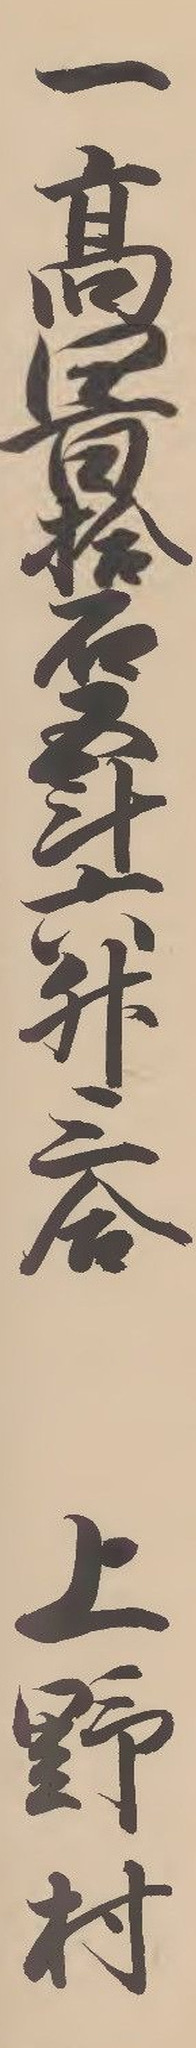一高四百拾石五斗六升三合上野村
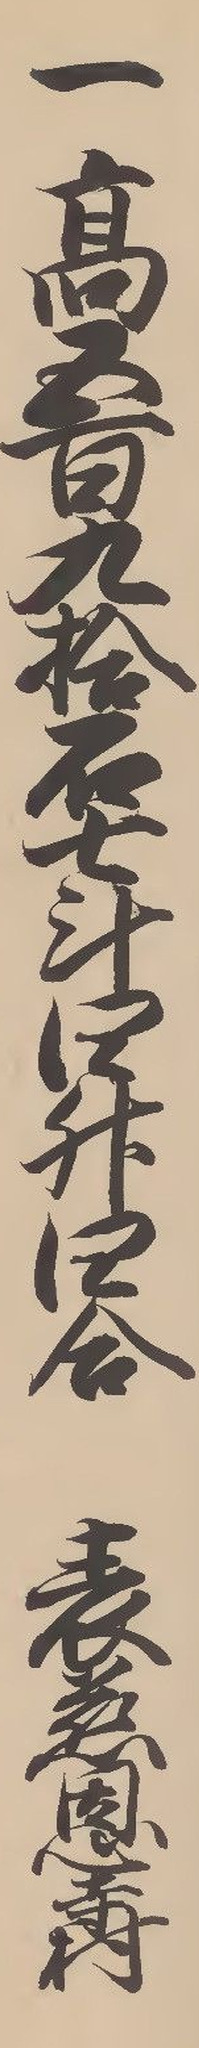一高五百九拾石七斗四升四合表慈恩寺村
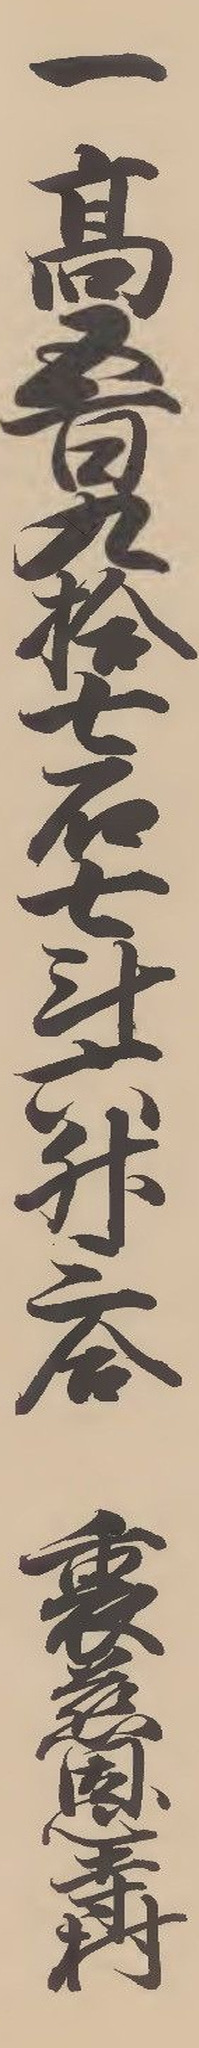一高五百九拾七石七斗六升三合裏慈恩寺村
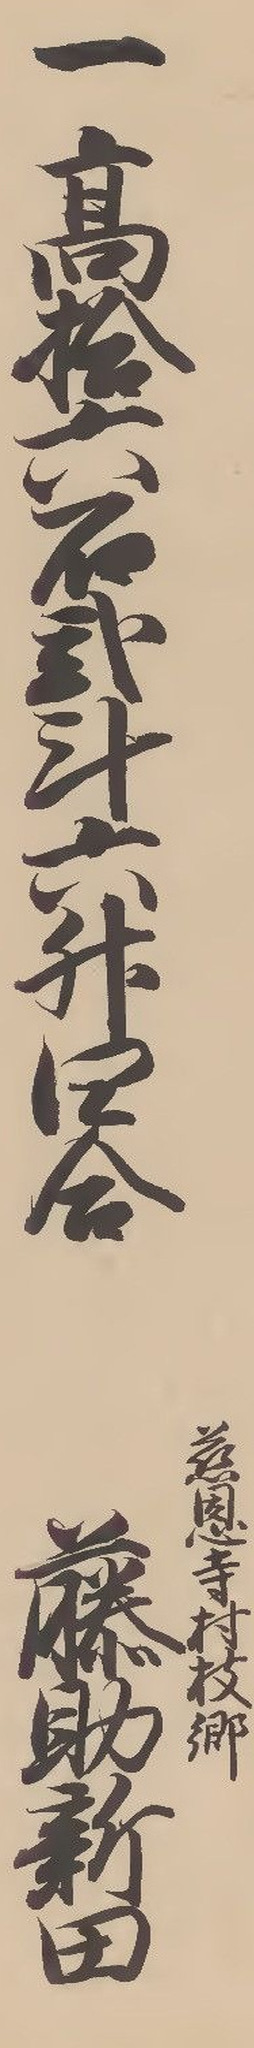一高拾六石弐斗六升四合藤助新田

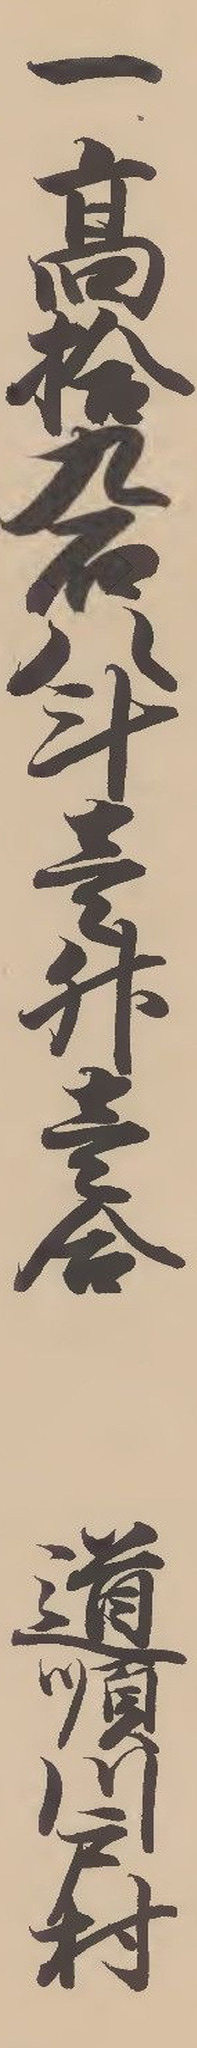一高拾九石八斗壱升壱合道順川戸村
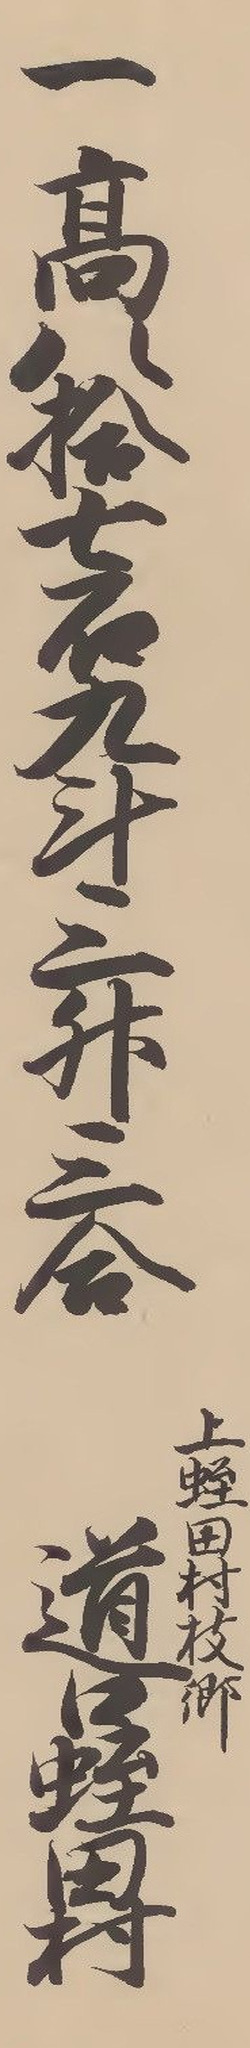一高八拾七石九斗三升三合道口蛭田村
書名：武蔵国郷帳　下
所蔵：国立公文書館 National Archives of Japan
